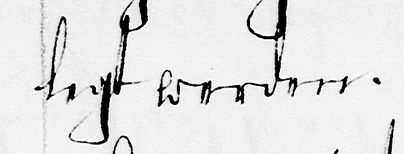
legt werden.
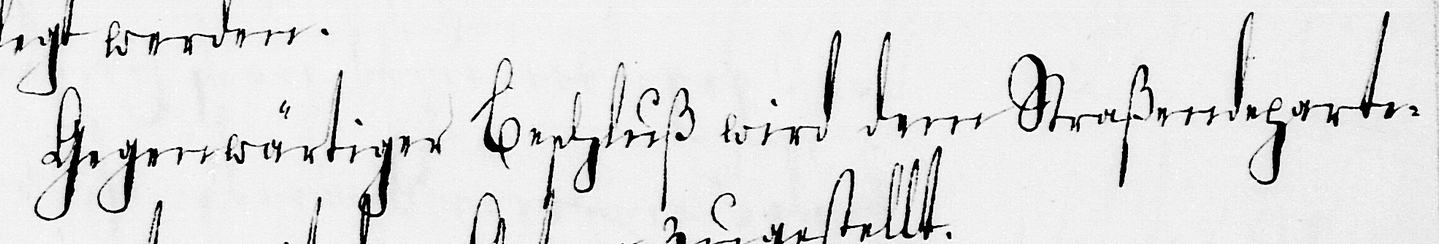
Gegenwärtiger Beschluß wird dem Straßendeparte¬
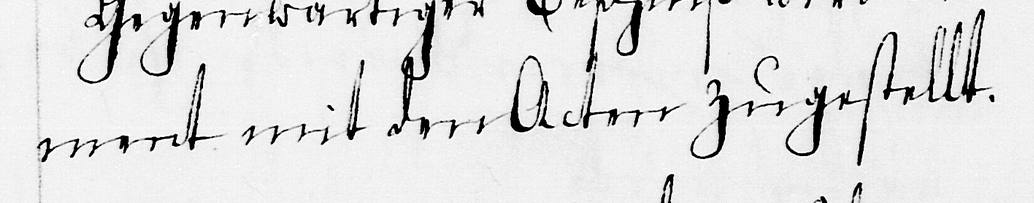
ment mit den Acten zugestellt.
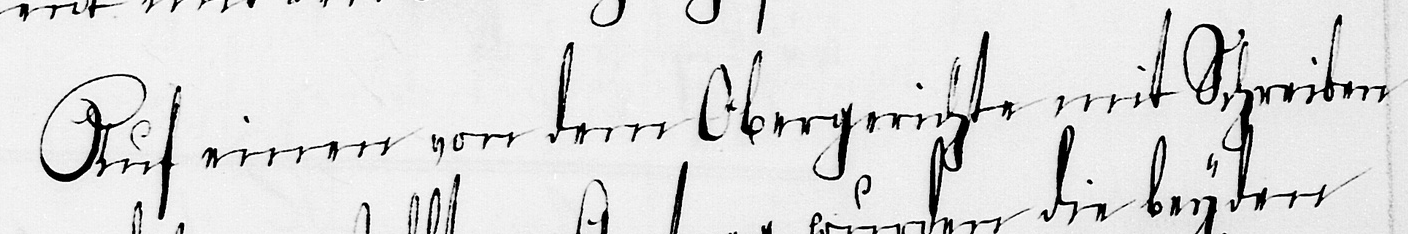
Auf einen von dem Obergerichte mit Schreiben
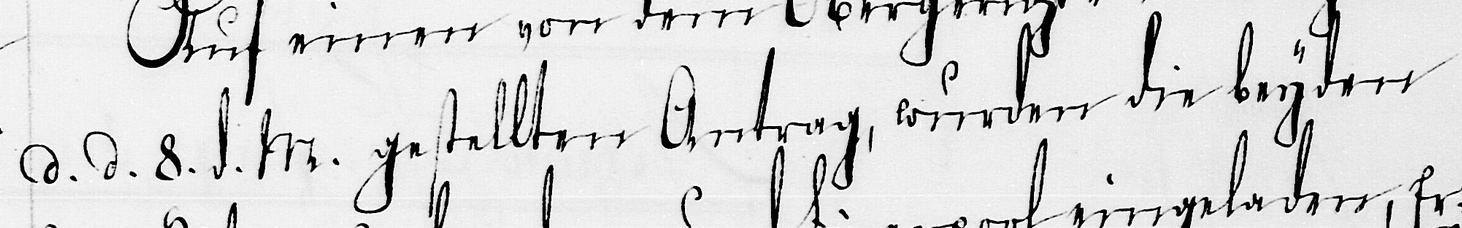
d. d. 8. d. M. gestellten Antrag, wurden die beyden
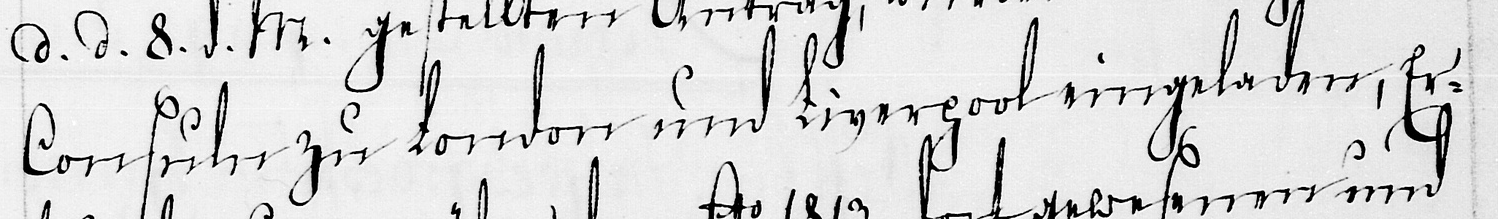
Consuln zu London und Liverpool eingeladen, Er¬
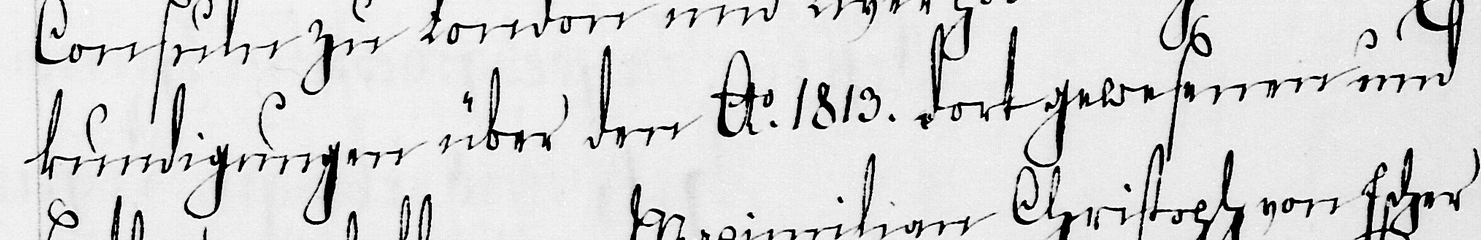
kundigungen über den Ao. 1813. dort gewesenen und
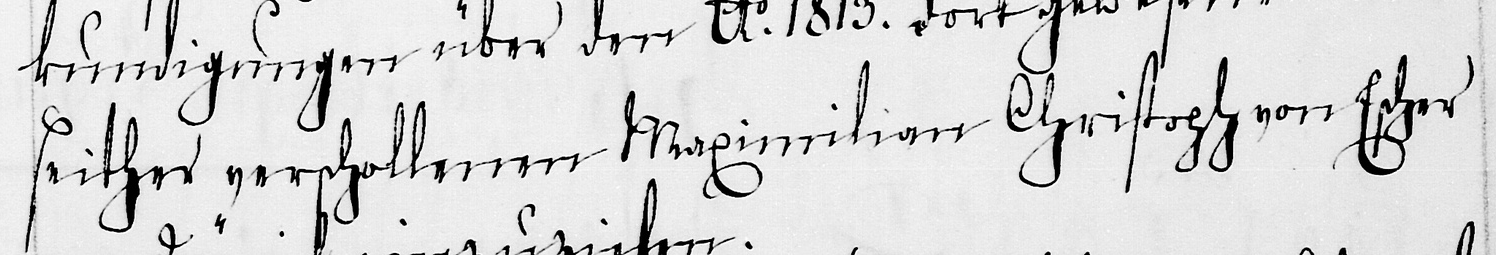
seither verschollenen Maximilian Christoph von Escher
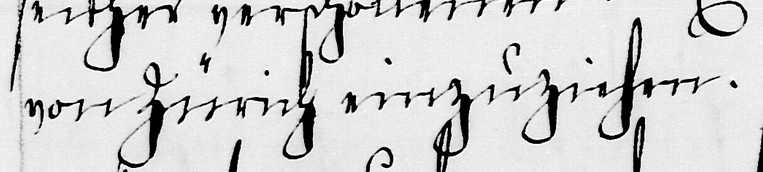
von Zürich einzuziehen.
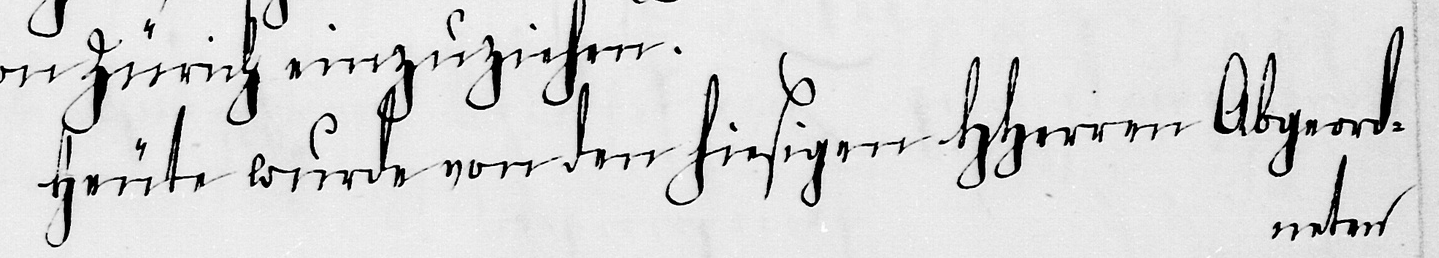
Heute wurde von den hiesigen HHerren Abgeord-
